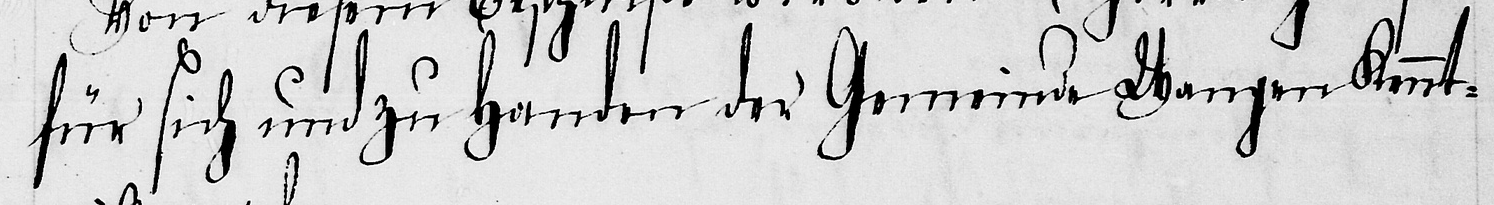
für sich und zu Handen der Gemeinde Wangen Kennt¬
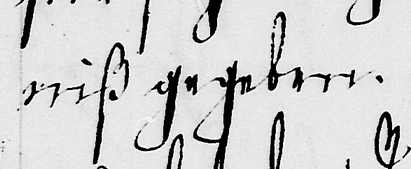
niß gegeben.
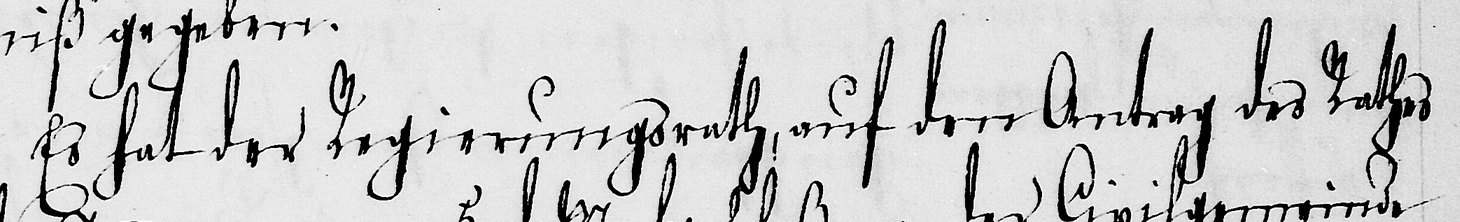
Es hat der Regierungsrath, auf den Antrag des Rath¬
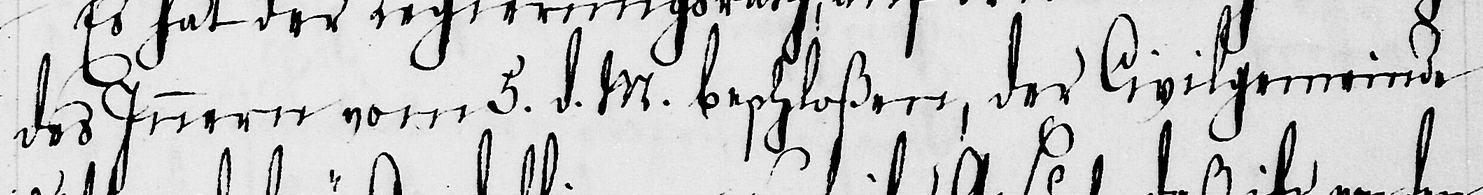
des Innern vom 5. d. M. beschloßen, der Civilgemeinde
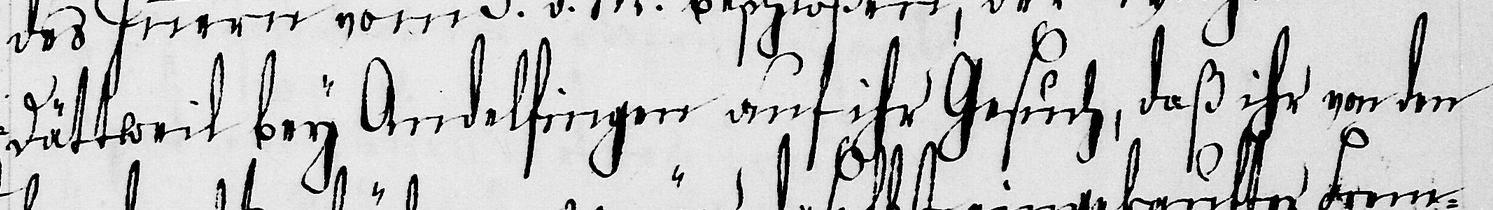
ättweil bey Andelfingen auf ihr Gesuch, daß ihr von
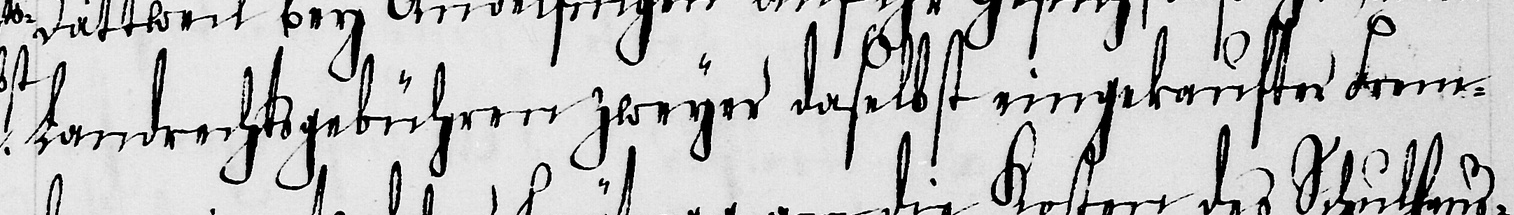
Landrechtsgebühren zweyer daselbst eingekaufter Frem¬
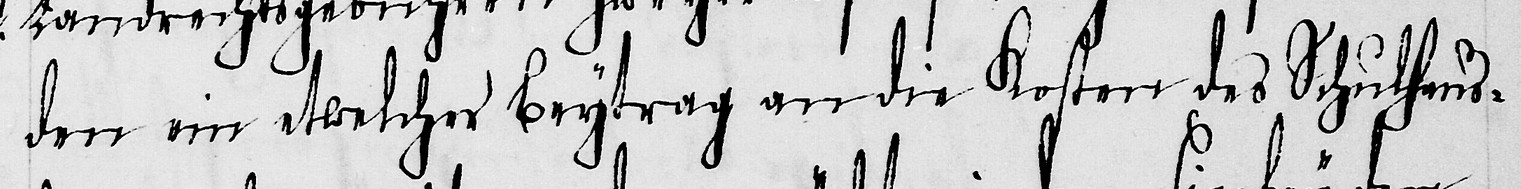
den ein etwelcher Beytrag an die Kosten des Schulhaus¬
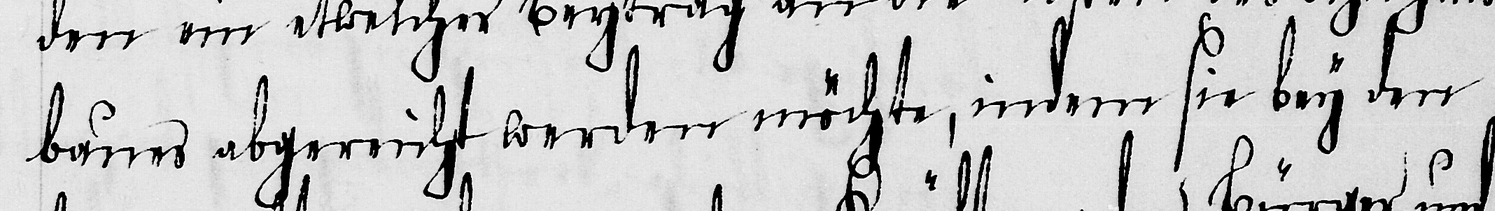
baues abgereicht werden möchte, indem sie bey den
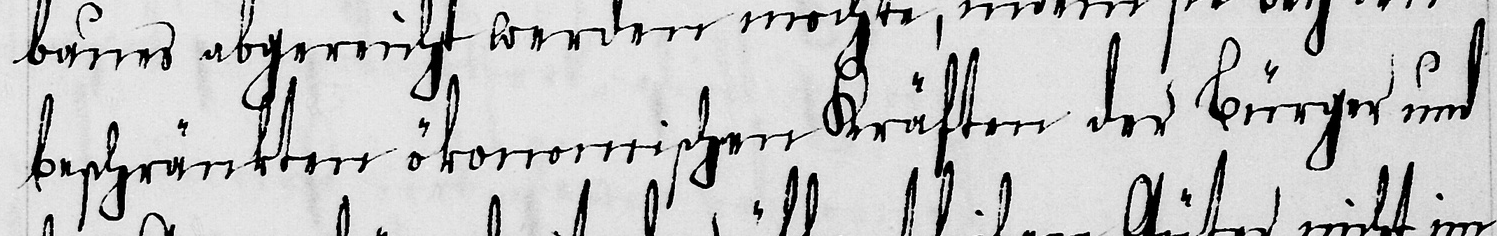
beschränkten ökonomischen Kräften der Bürger und
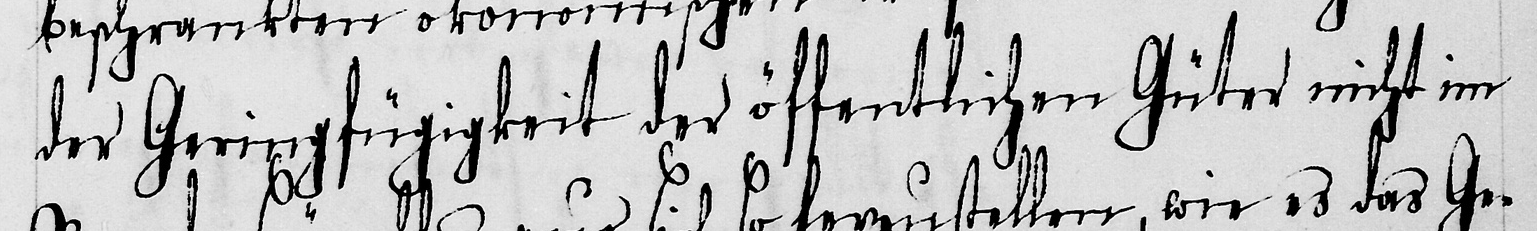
der Geringfügigkeit der öffentlichen Güter nicht im
